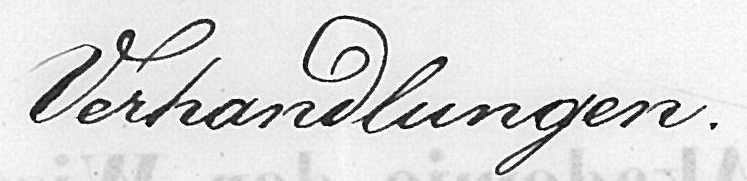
Verhandlungen.
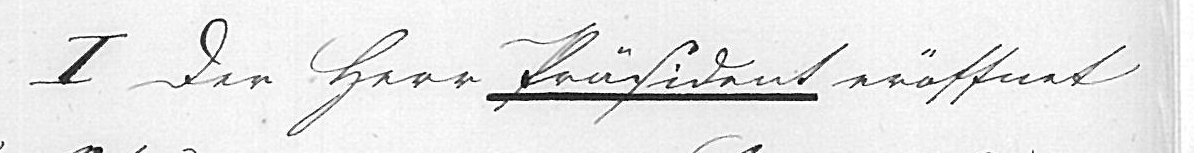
I Der Herr Präsident eröffnet
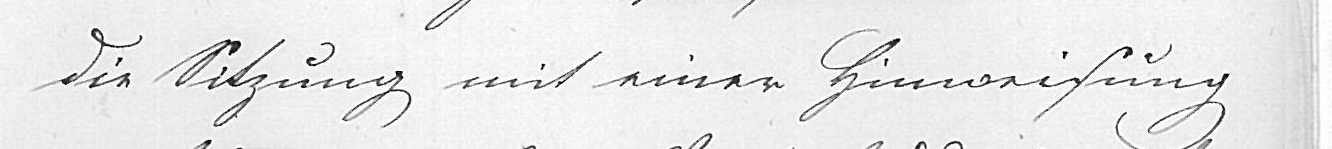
die Sitzung mit einer Hinweisung
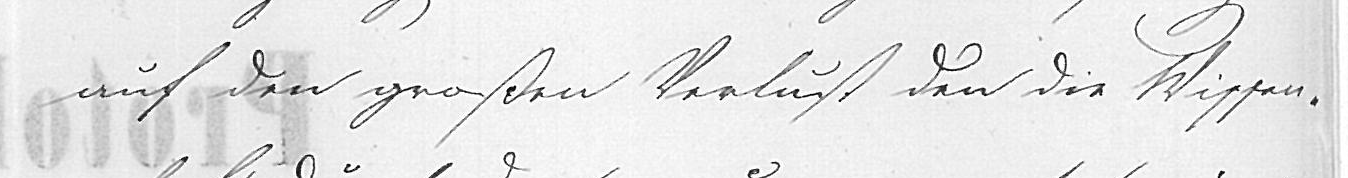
auf den großen Verlust den die Wissen-
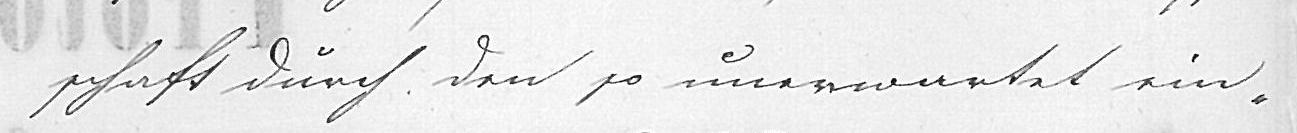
schaft durch den so erwartet ein-
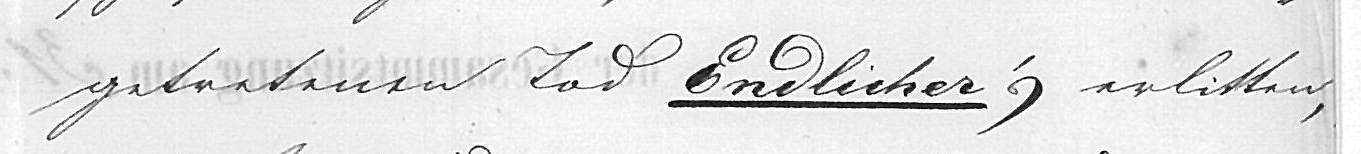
getretenden Tod Endlicher's erlitten,
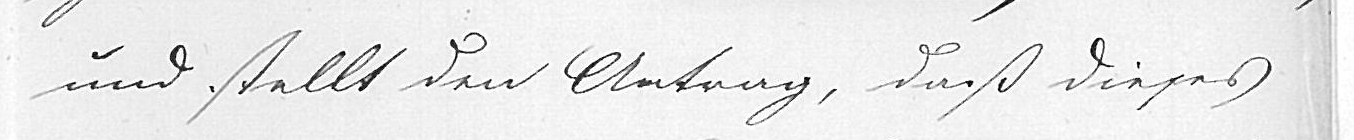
und stellt den Antrag, daß dieses
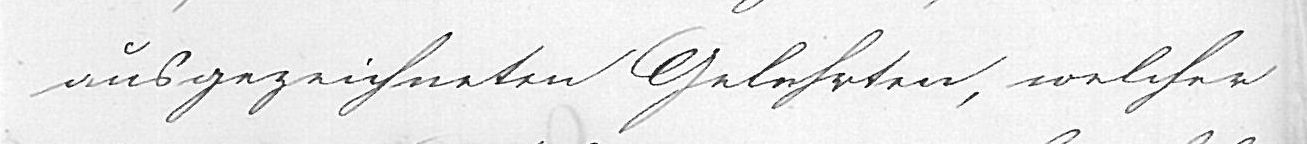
ausgezeichneten Gelehrten, welcher
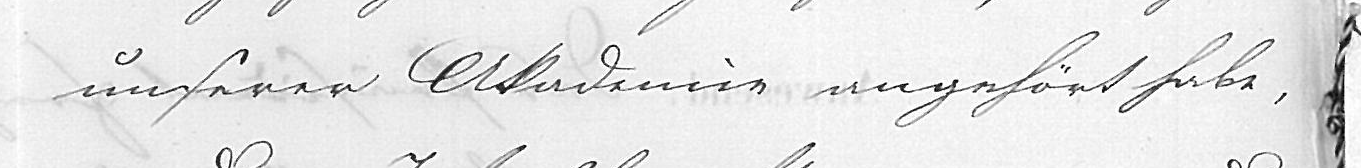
unserer Akademie angehört habe,
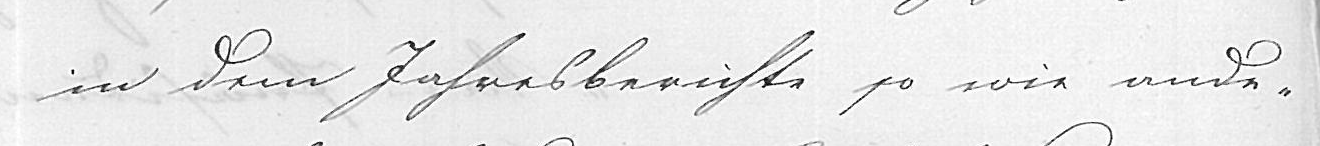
in dem Jahresberichte so wie ande-
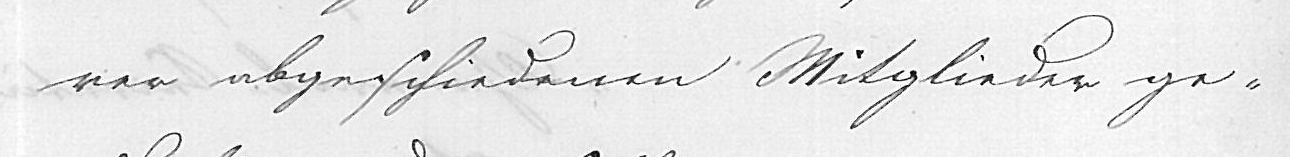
rer abgeschiedenen Mitglieder ge-
